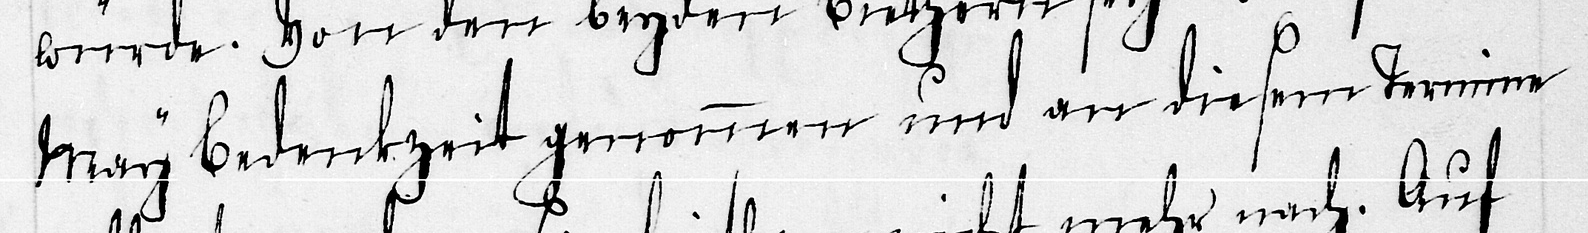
May Bedenkzeit genommen und an diesem Termine
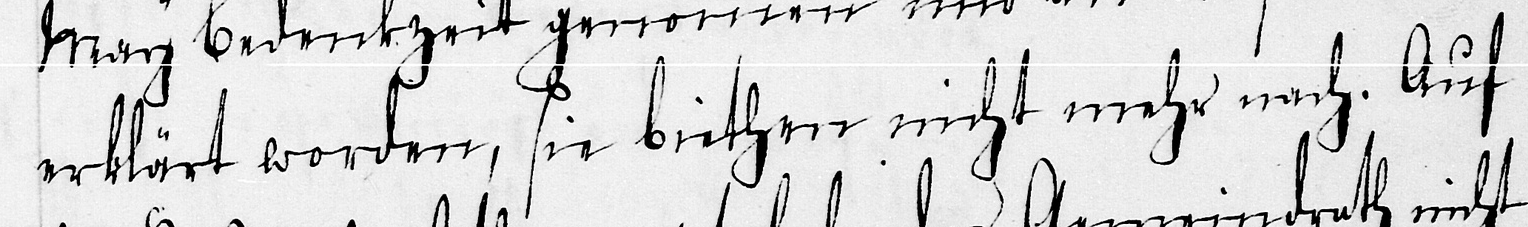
erklärt worden, sie biethen nicht mehr nach. Auf
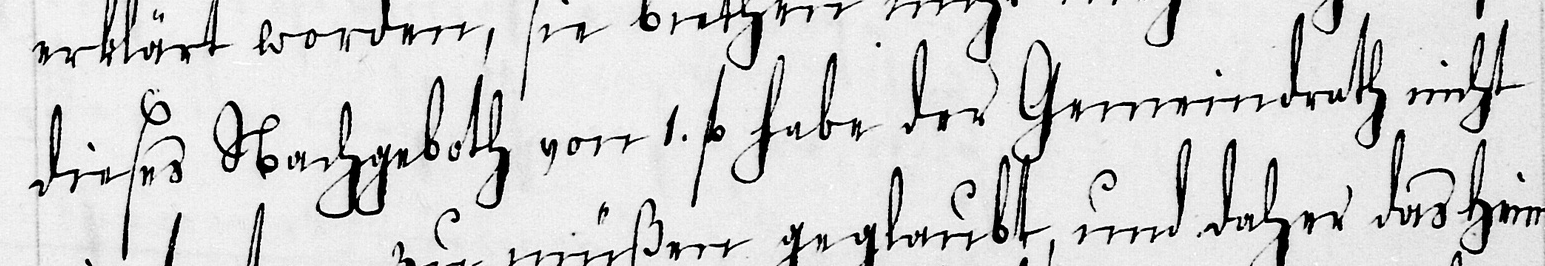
dieses Nachgeboth von 1. fl. habe der Gemeindrath nicht
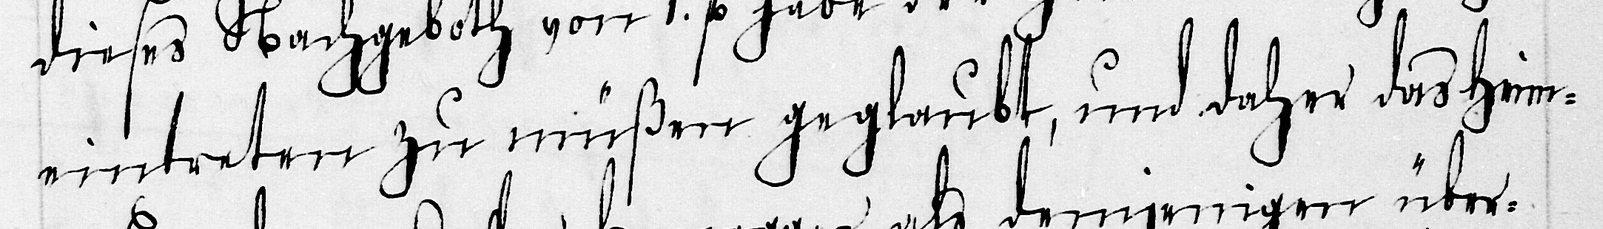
eintreten zu müßen geglaubt, und daher das Heim¬
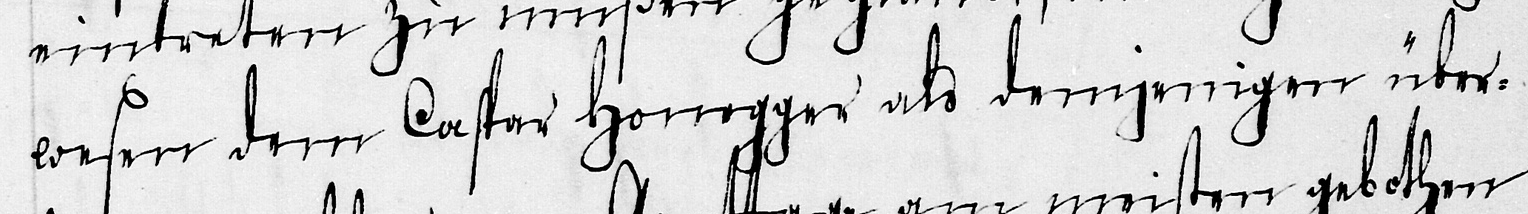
wesen dem Caspar Honegger als demjenigen über¬
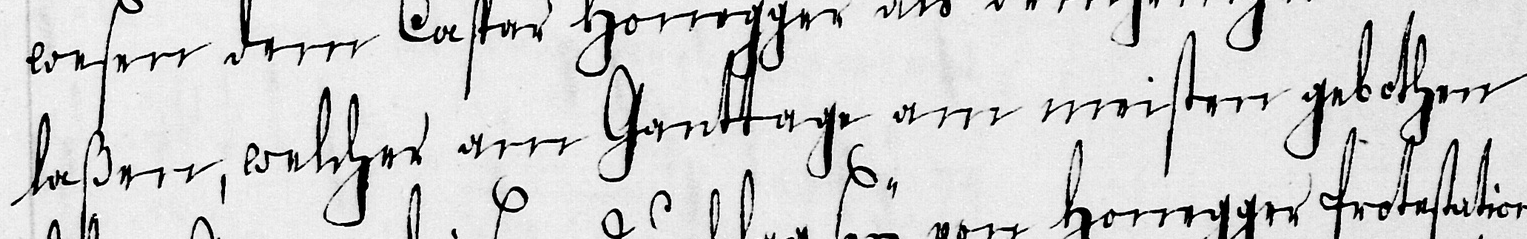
laßen, welcher am Ganttage am meisten gebothen
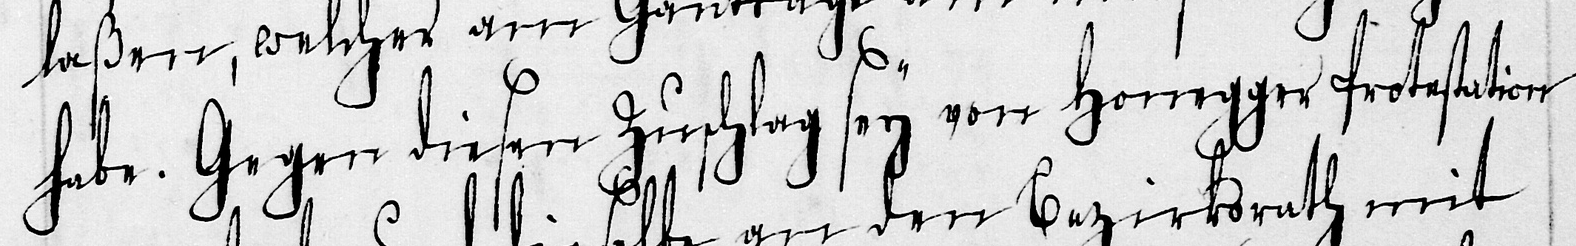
habe. Gegen diesen Zuschlag sey von Honegger Protestati¬
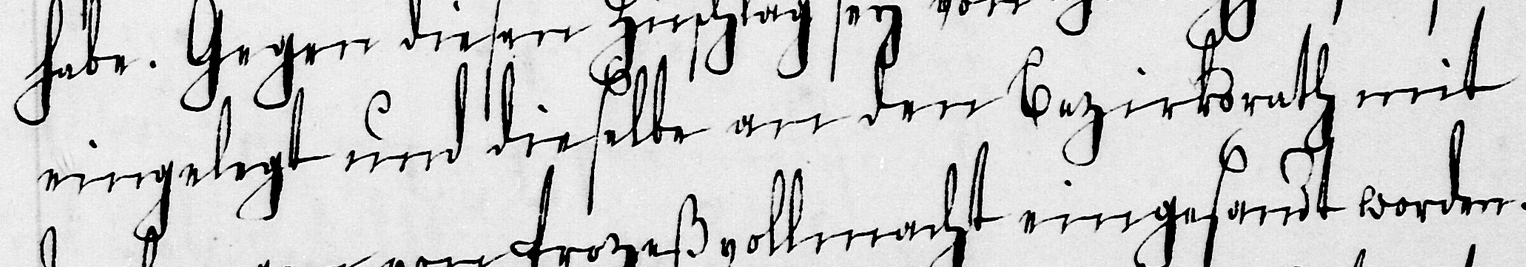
eingelegt und dieselbe an den Bezirksrath mit
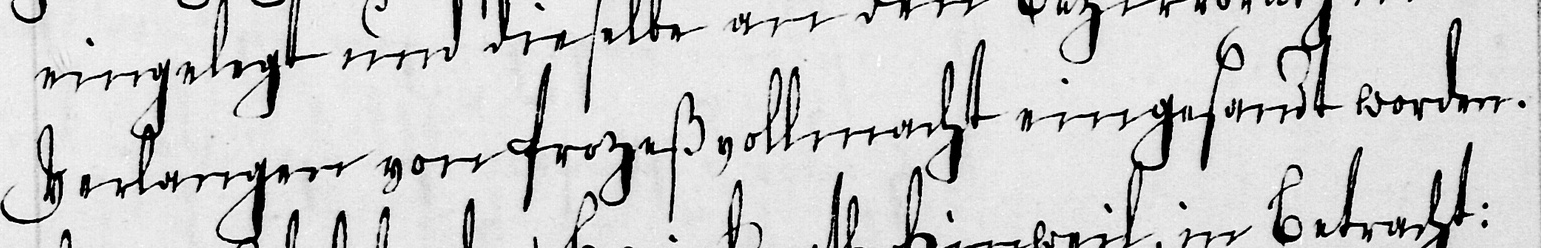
Verlangen von Prozeßvollmacht eingesandt worden.
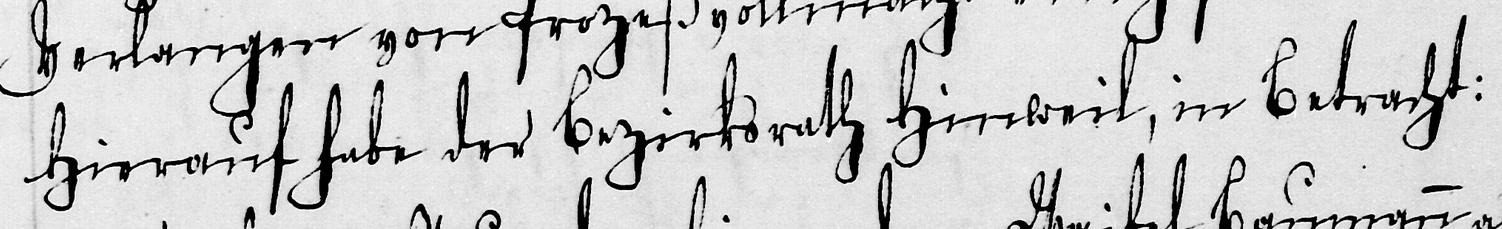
Hierauf habe der Bezirksrath Hinweil, in Betracht:
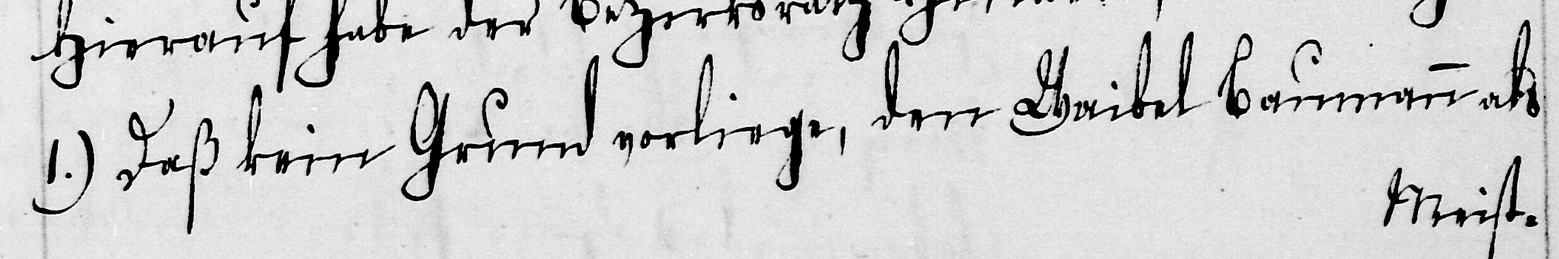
1.) Daß kein Grund vorliege, den Waibel Baumann als
